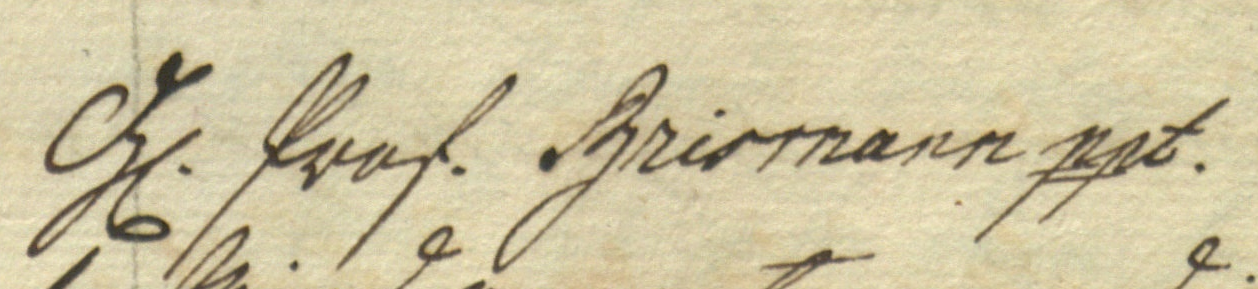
dh. Prof. Brismann ppt.
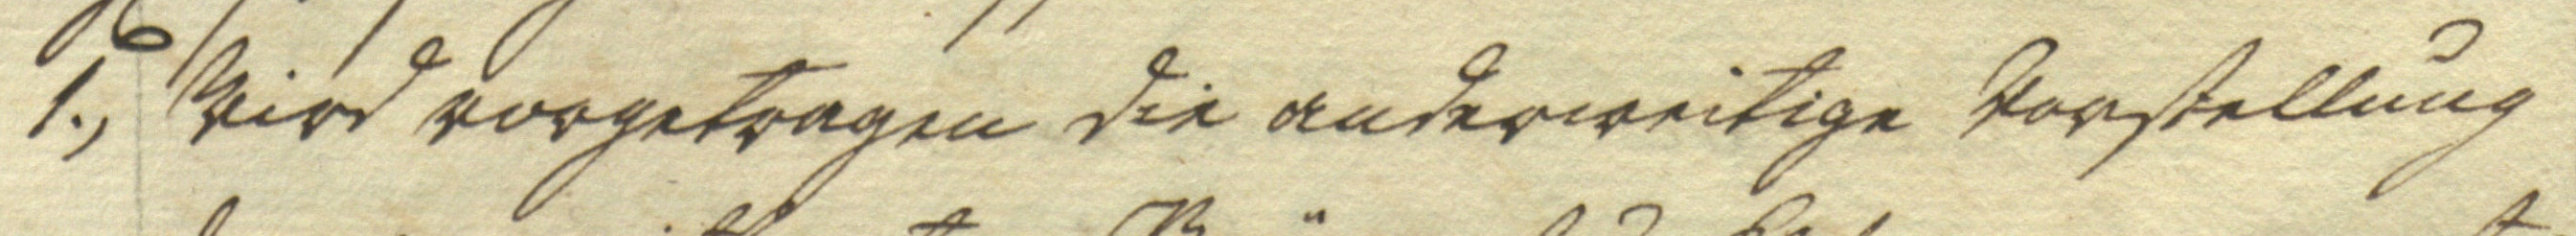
1., Wird vorgetragen die anderweitige Vorstellung
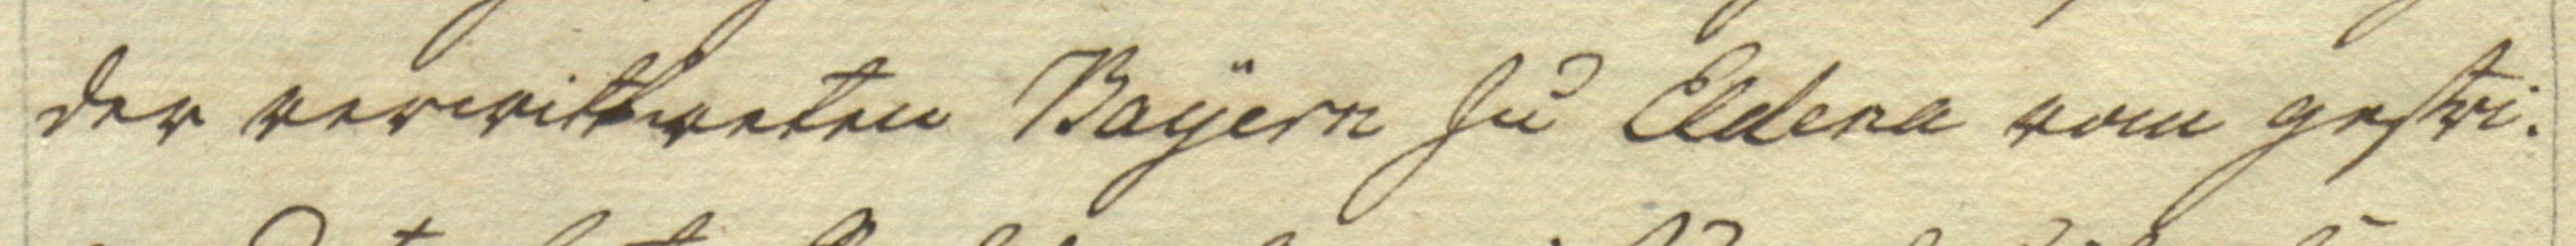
der verwittweten Baÿern zu Eldena vom gestri¬
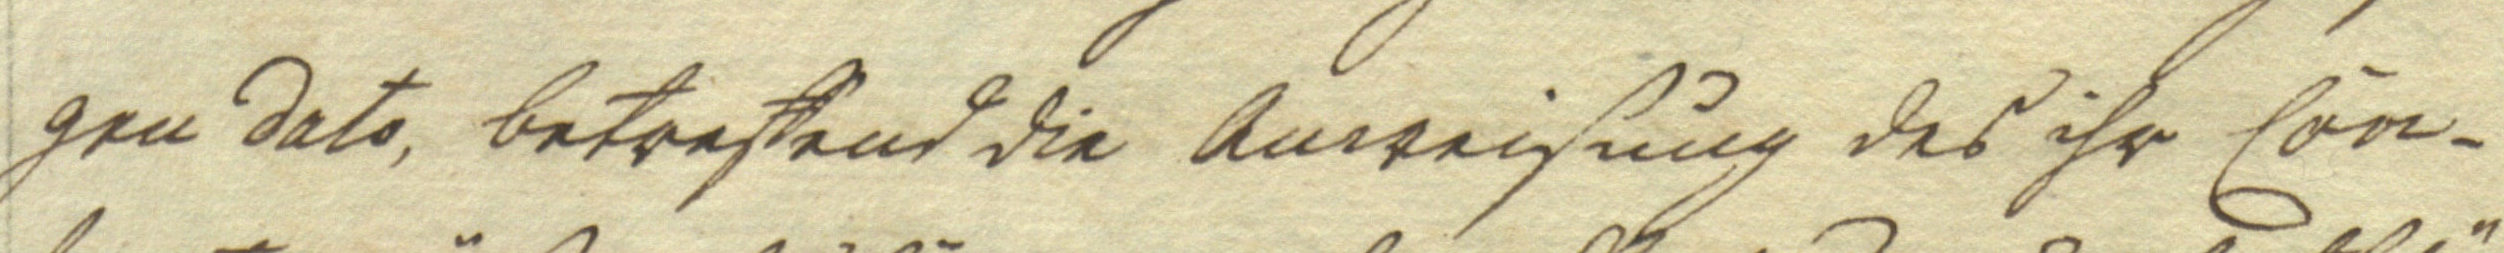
gen dato, betreffend die Anweisung des ihr Con¬
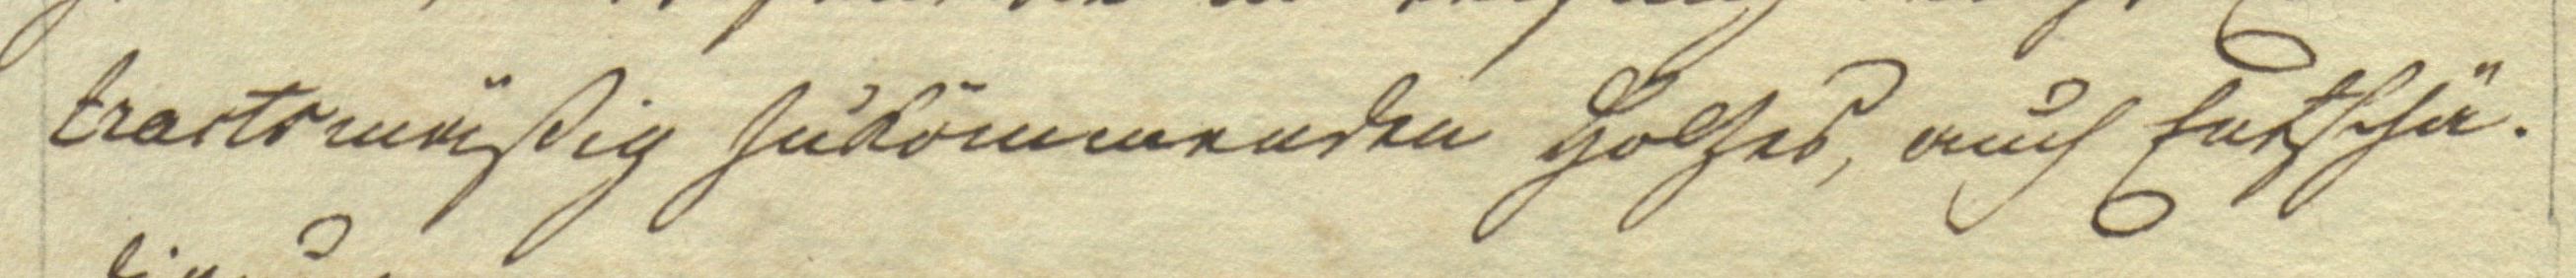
tractsmäßig zukommenden Holzes, auch Entschä¬
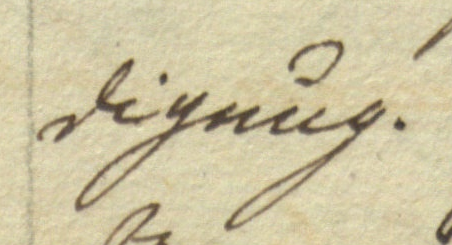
digung.
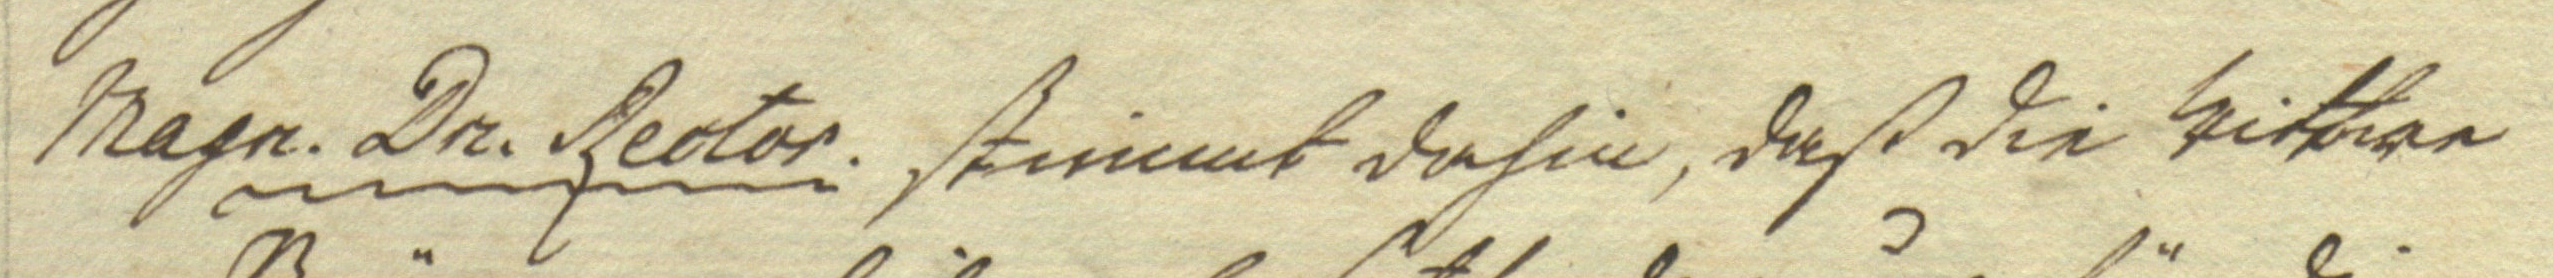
Magn. Dn. Rector. stimmt dahin, daß die Wittwe
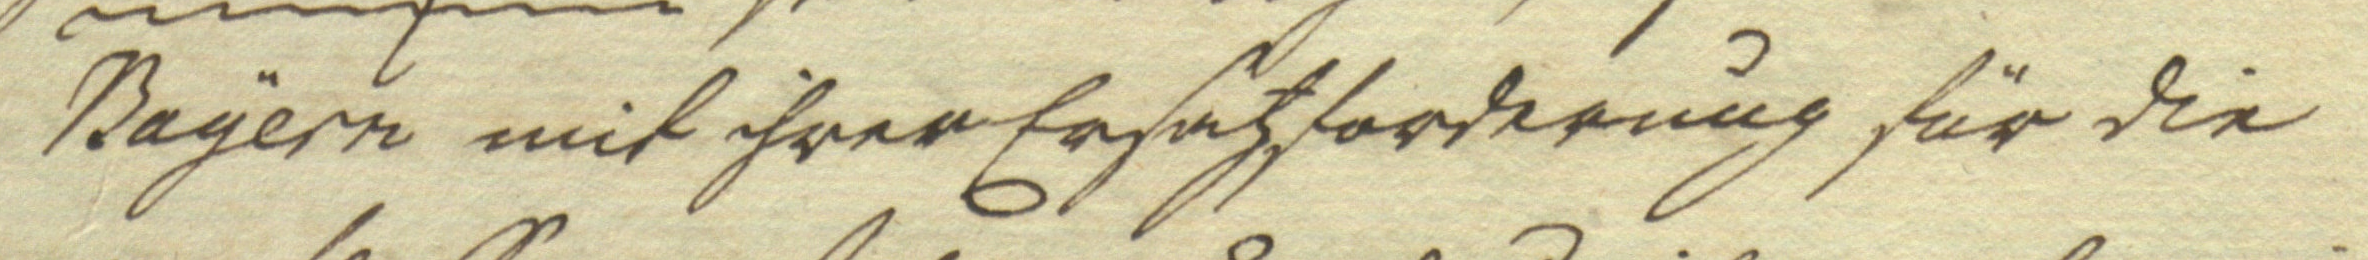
Baÿern mit ihrer Ersatzforderung für die
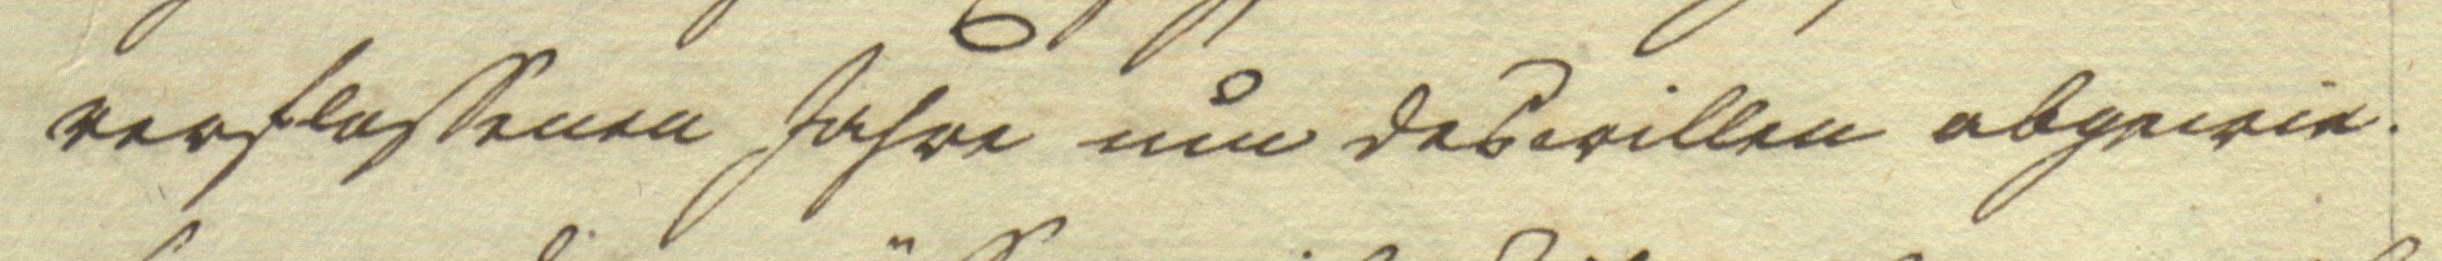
verflossenen Jahre um deswillen abgewie¬
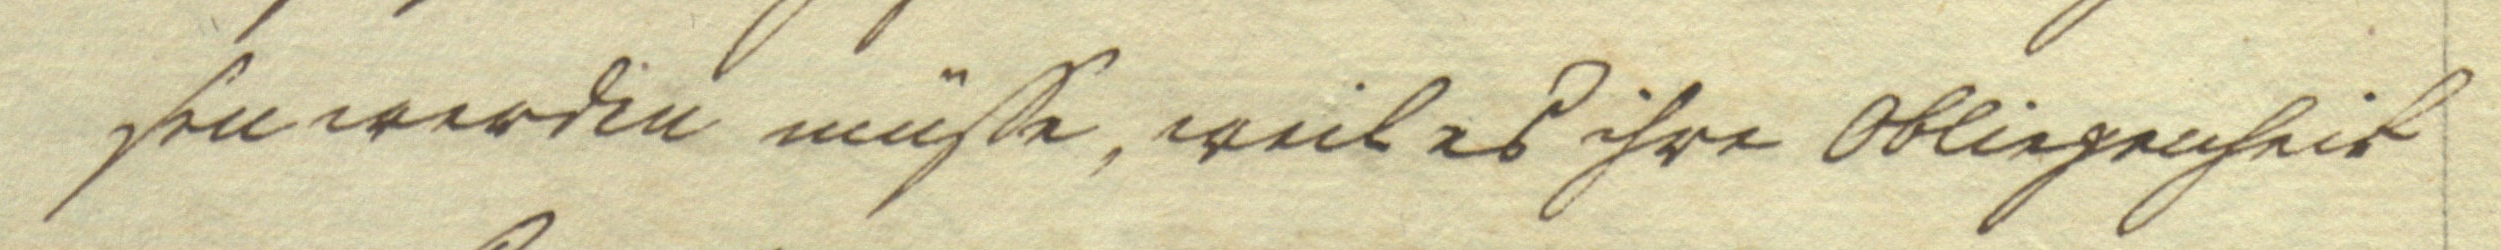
sen werden müsse, weil es ihre Obliegenheit
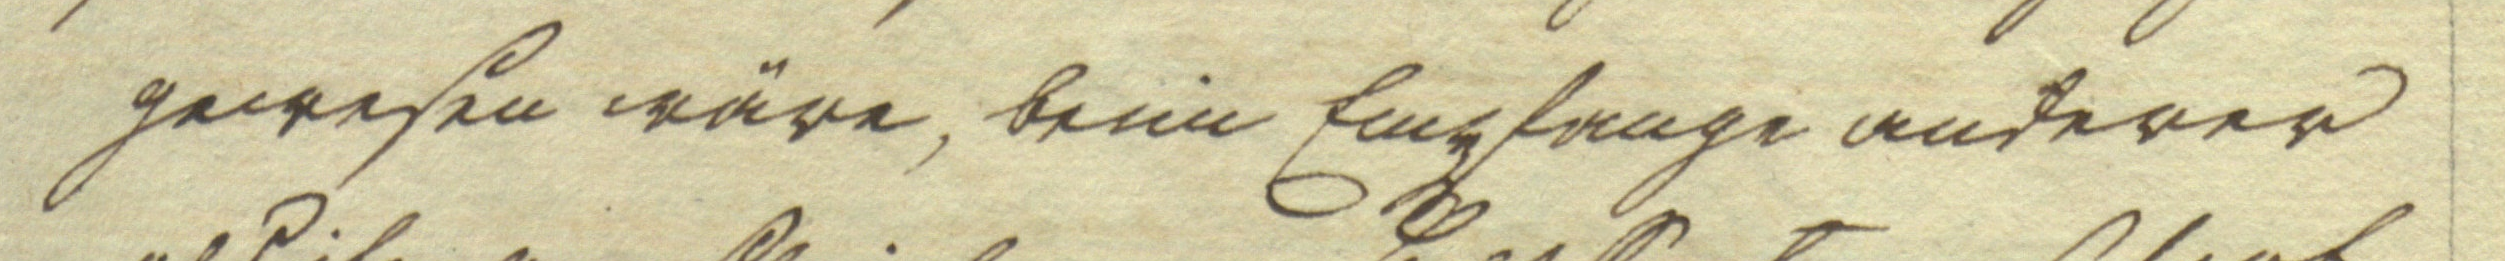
gewesen wäre, beim Empfang anderer
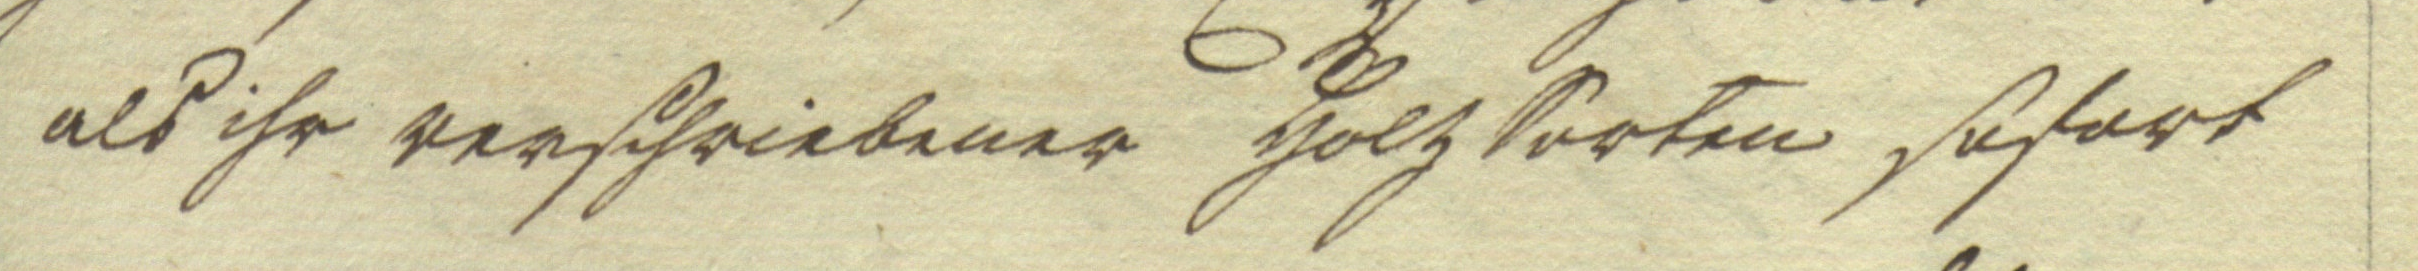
als ihr verschriebener Holz Sorten sofort
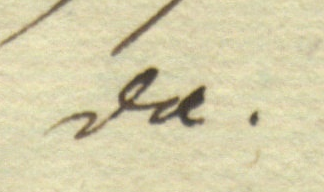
da¬
